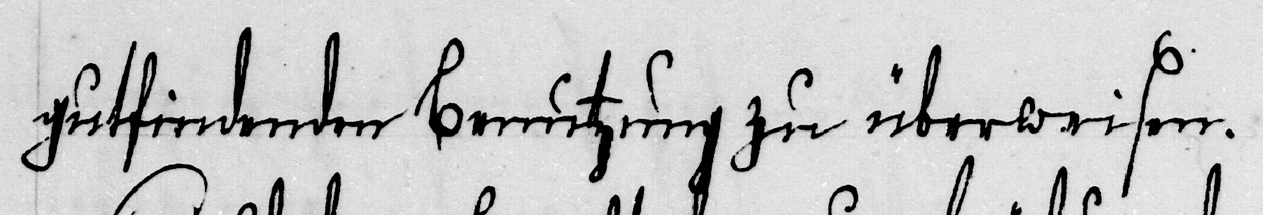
gutfindenden Benutzung zu überweisen.
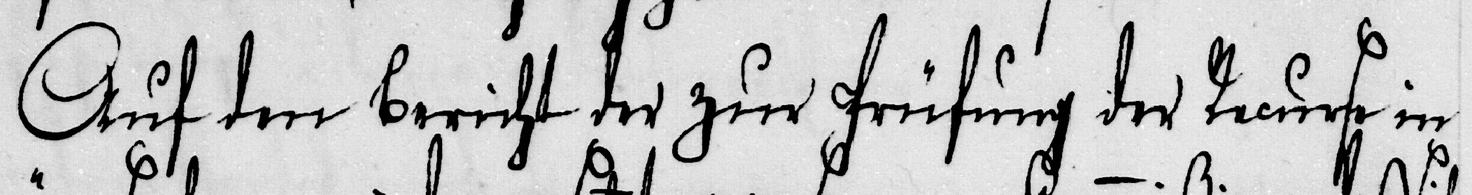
Auf den Bericht der zur Prüfung der Recurse in
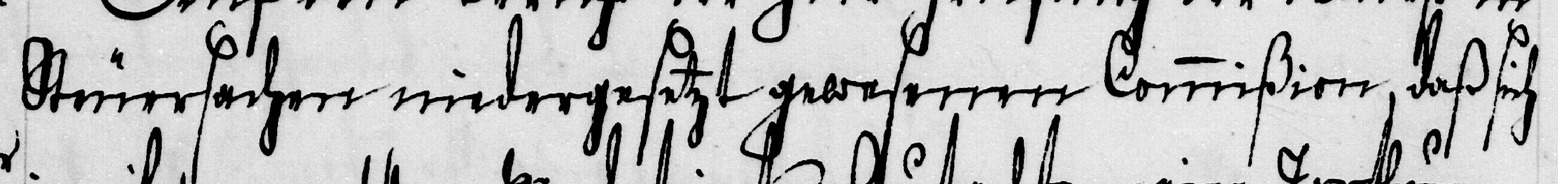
Steuersachen niedergesetzt gewesenen Commißion, daß sich
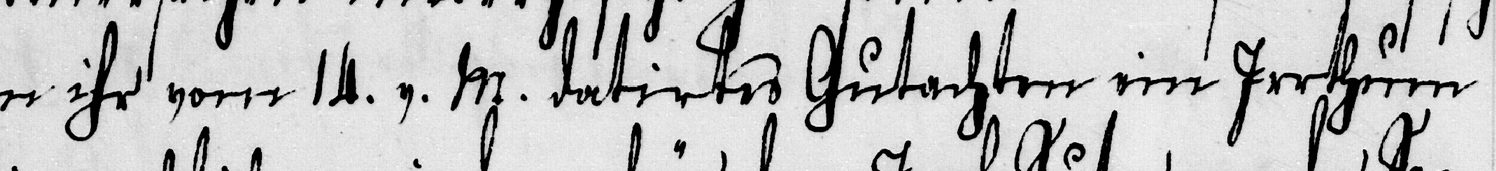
in ihr vom 14. v. M. datirtes Gutachten ein Irrthum
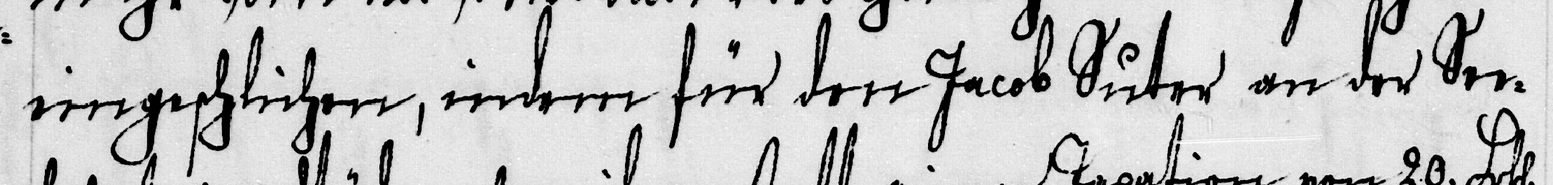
eingeschlichen, indem für den Jacob Suter an der See¬
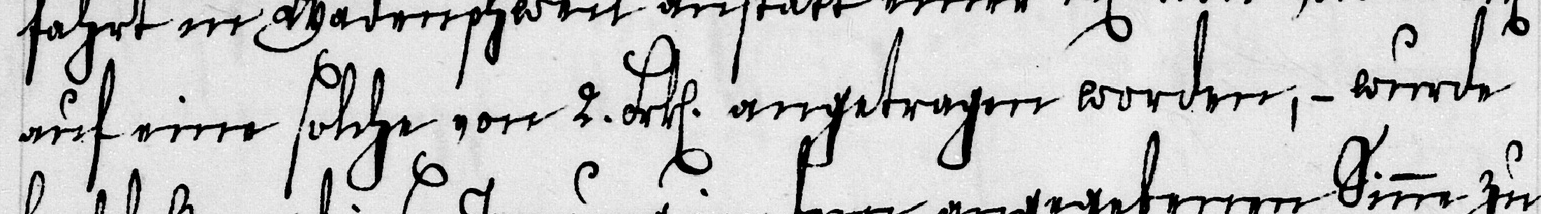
auf eine solche von 2. Frk[en]. angetragen worden, – wurde
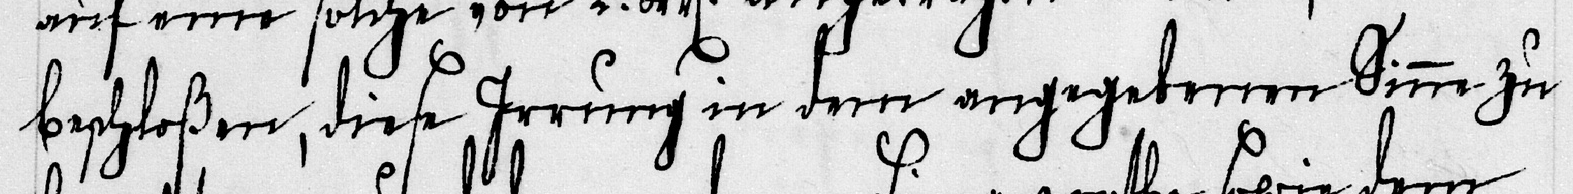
beschloßen, diese Irrung in dem angegebenen Sinne zu
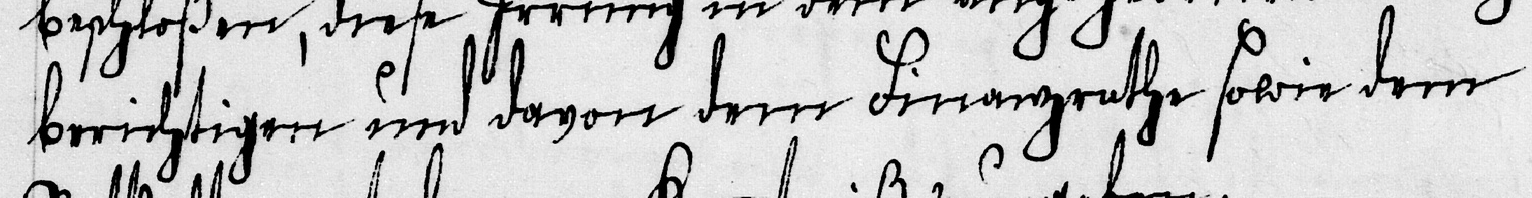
berichtigen und davon dem Finanzrathe sowie dem
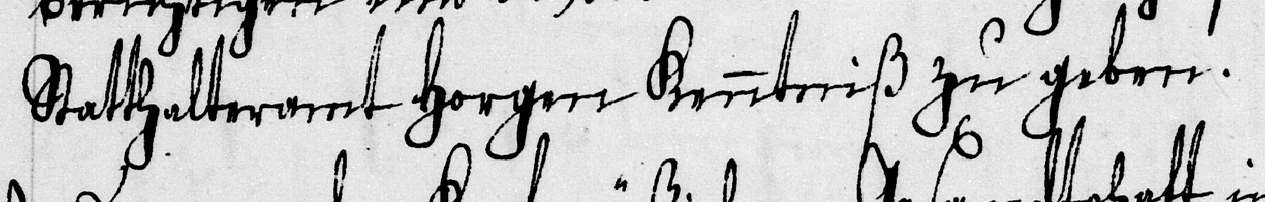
Statthalteramt Horgen Kenntniß zu geben.
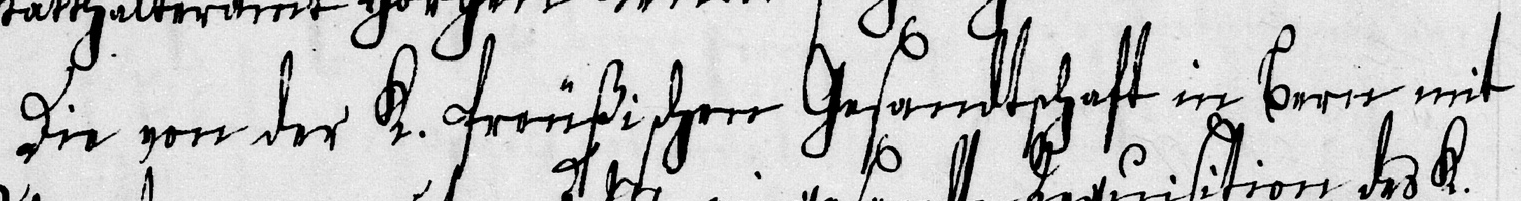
Die von der K. Preußischen Gesandtschaft in Bern mit
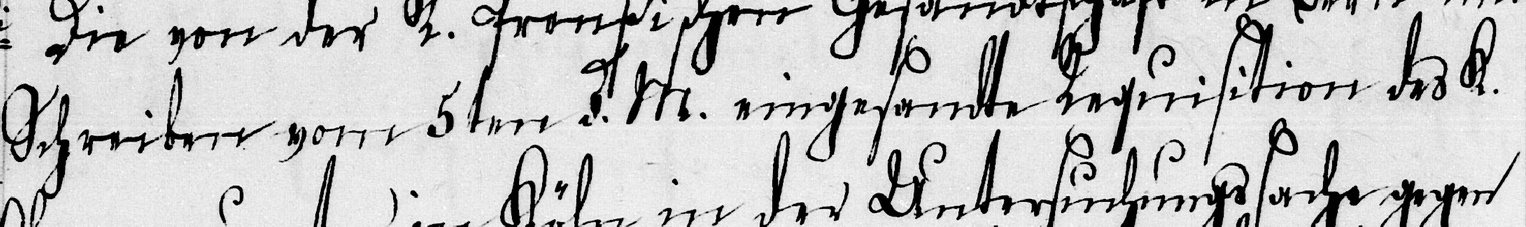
Schreiben vom 5ten d. M. eingesandte Requisition des K.
